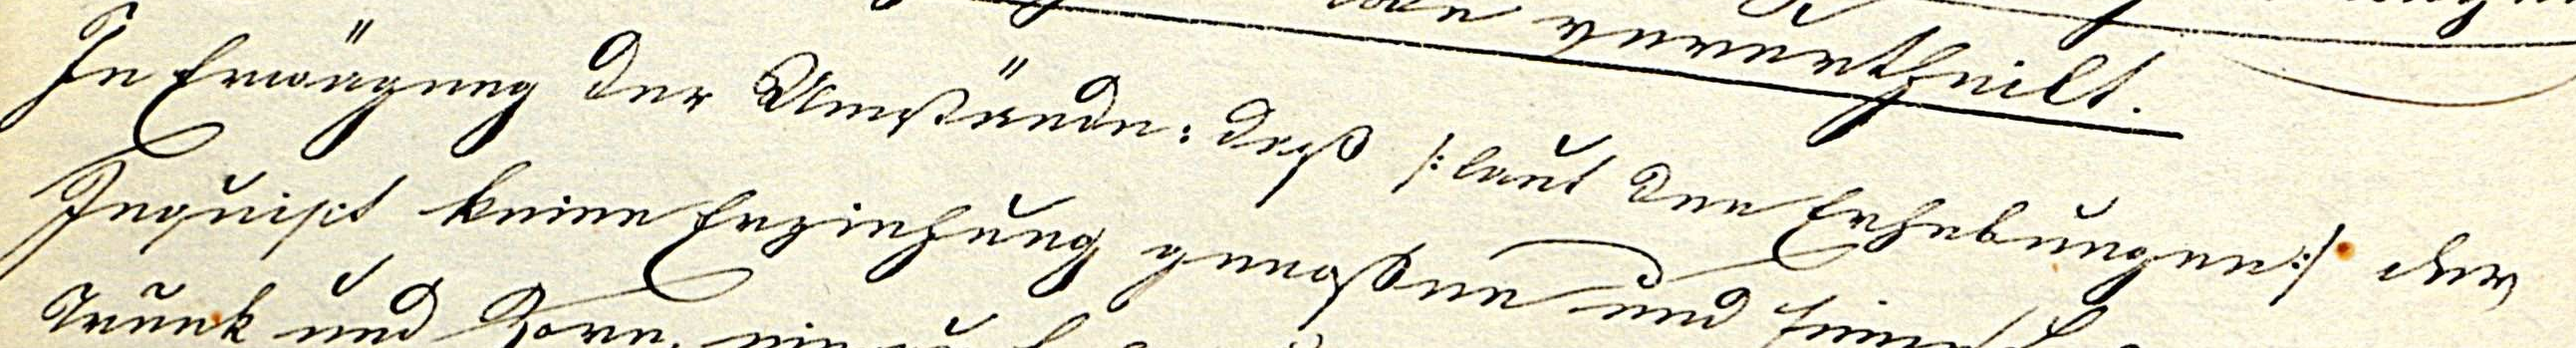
In Erwägung der Umstände: daß (laut der Erhebungen) der
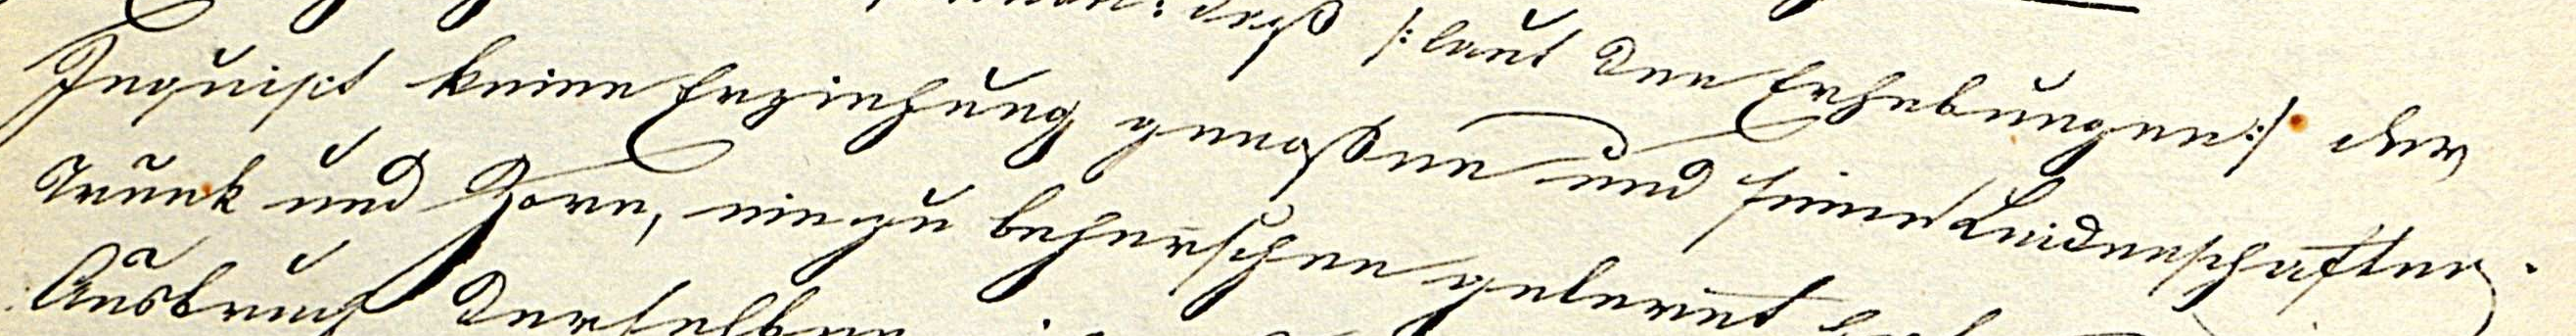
Inquisit keine Erziehung genoßen und seine Leidenschaften,
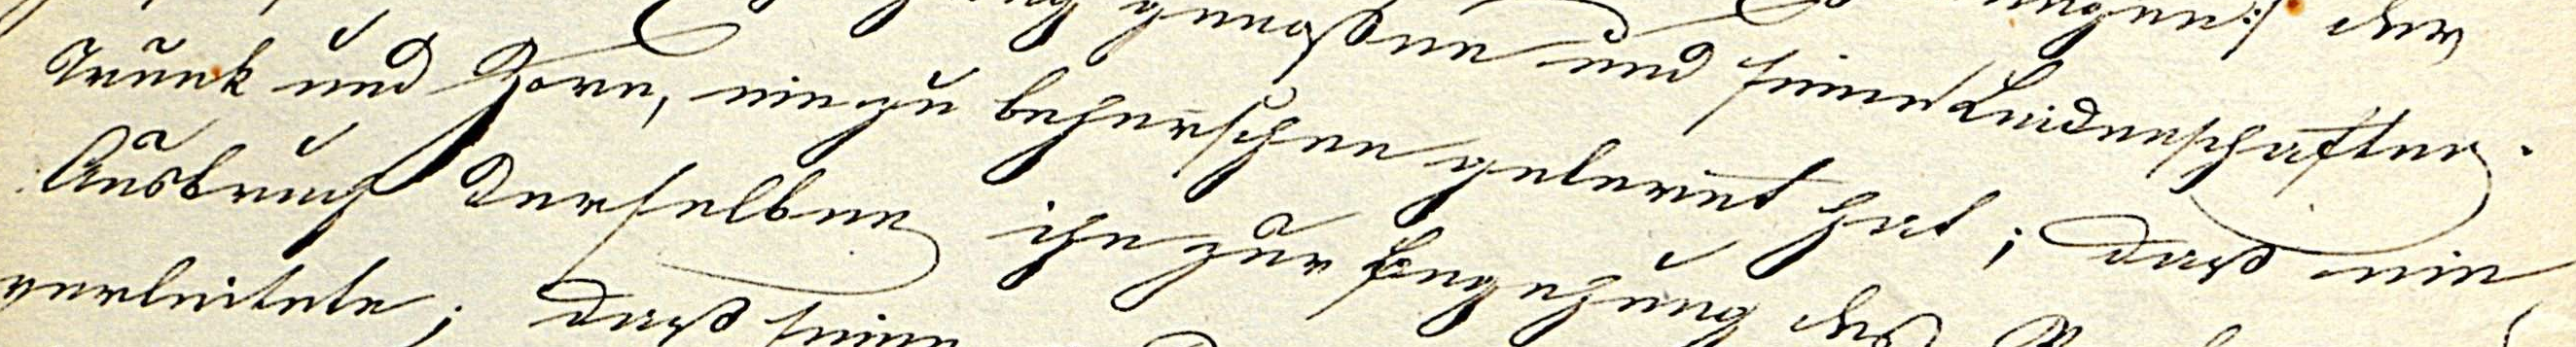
Trunk und Zorn, nie zu beherrschen gelernt hat; daß ein
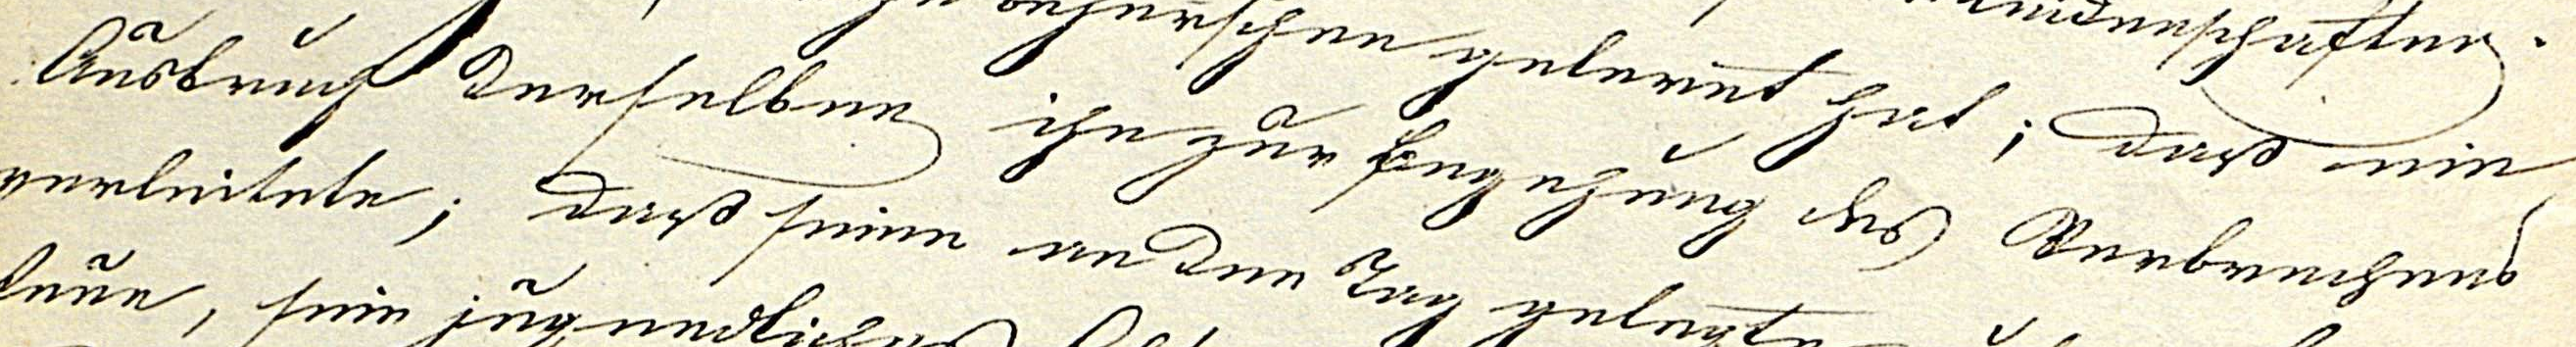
Ausbruch derselben ihn zur Begehung des Verbrechens
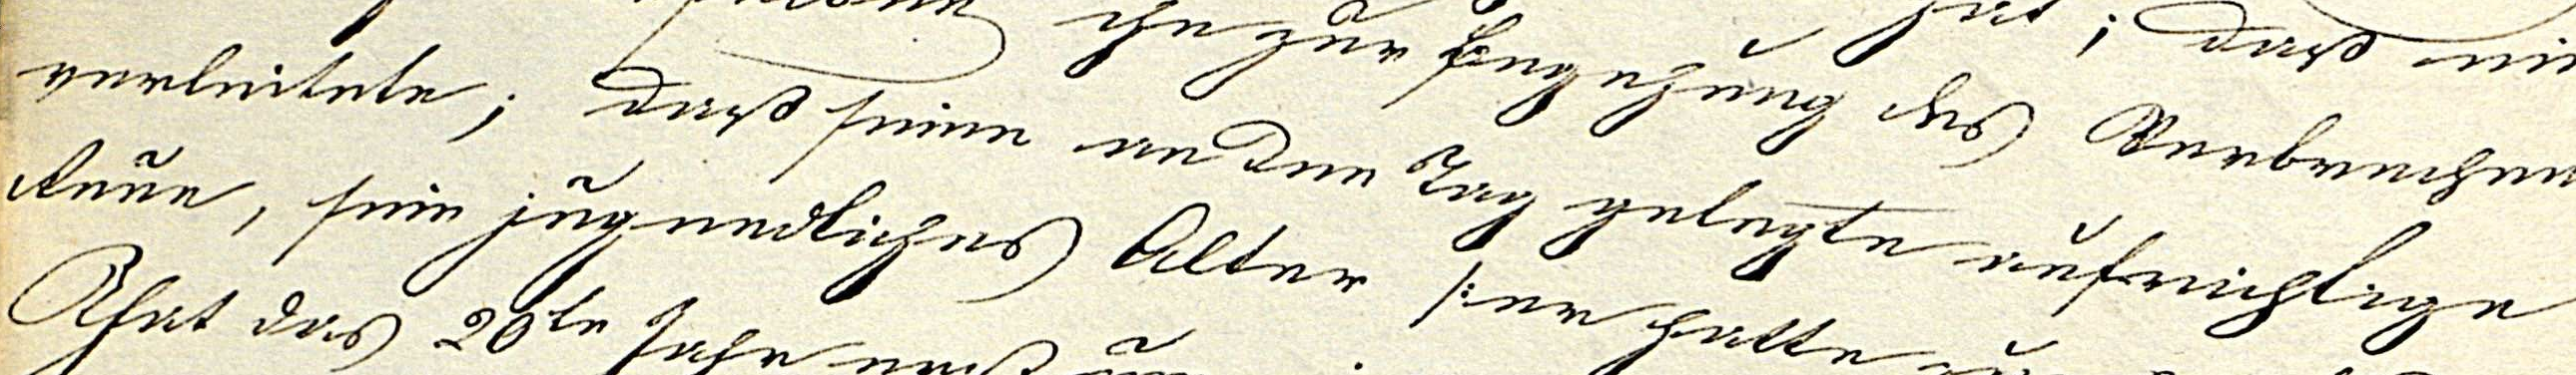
verleitete; daß seine an den Tag gelegte aufrichtige
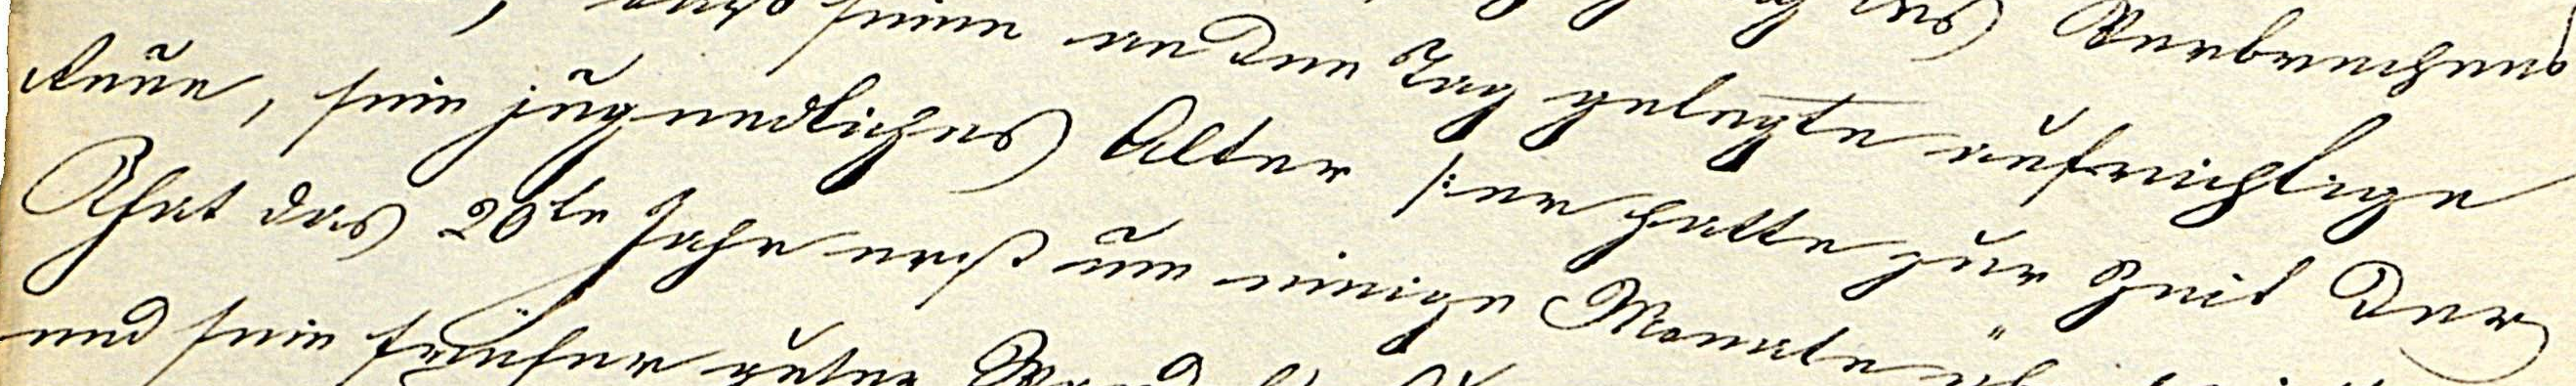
Reue, sein jugendliches Alter (er hatte zur Zeit der
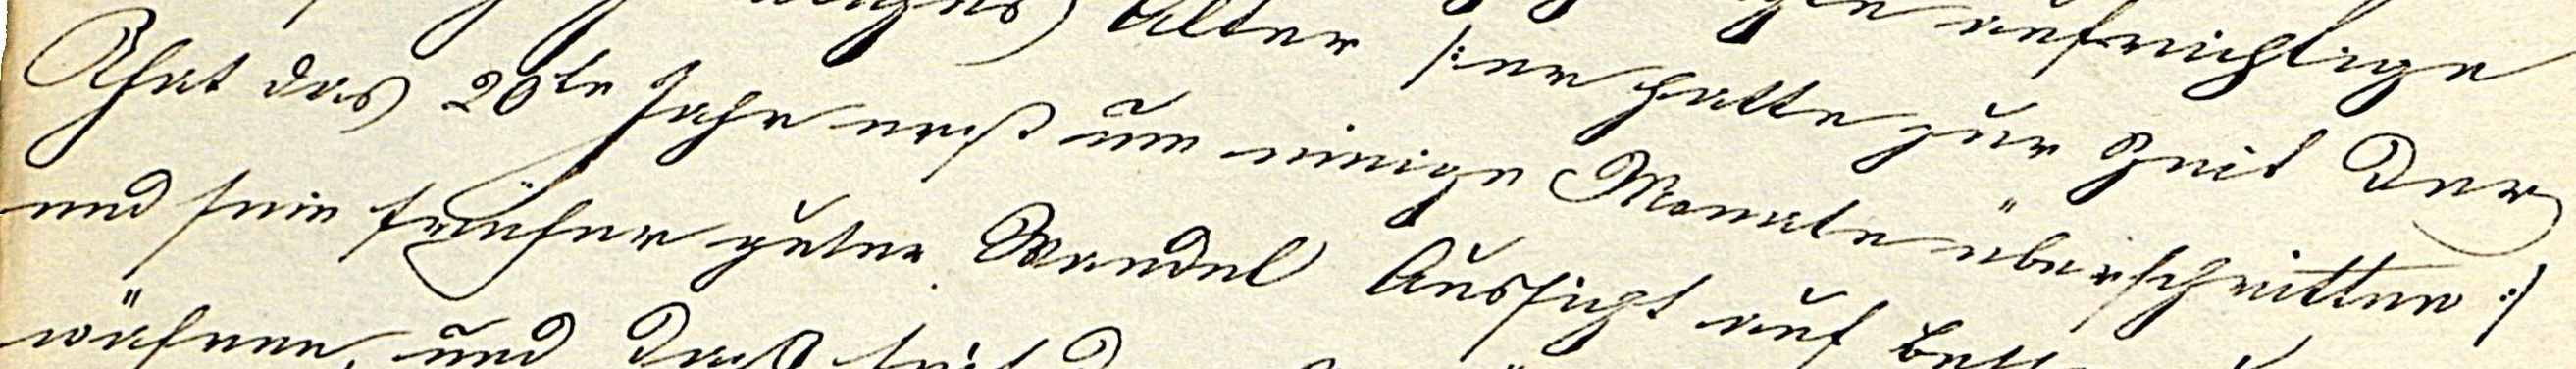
That das 20te Jahr erst um einige Monate überschritten)
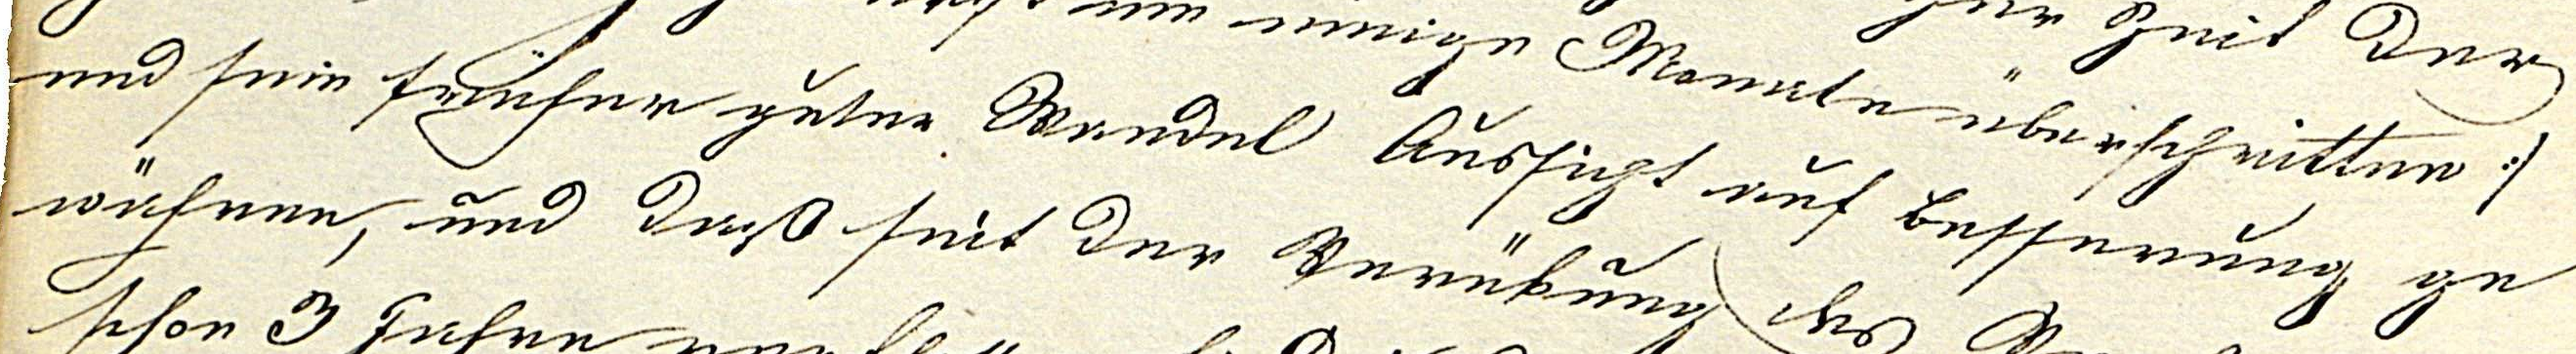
und sein früher guter Wandel Aussicht auf Besserung ge¬
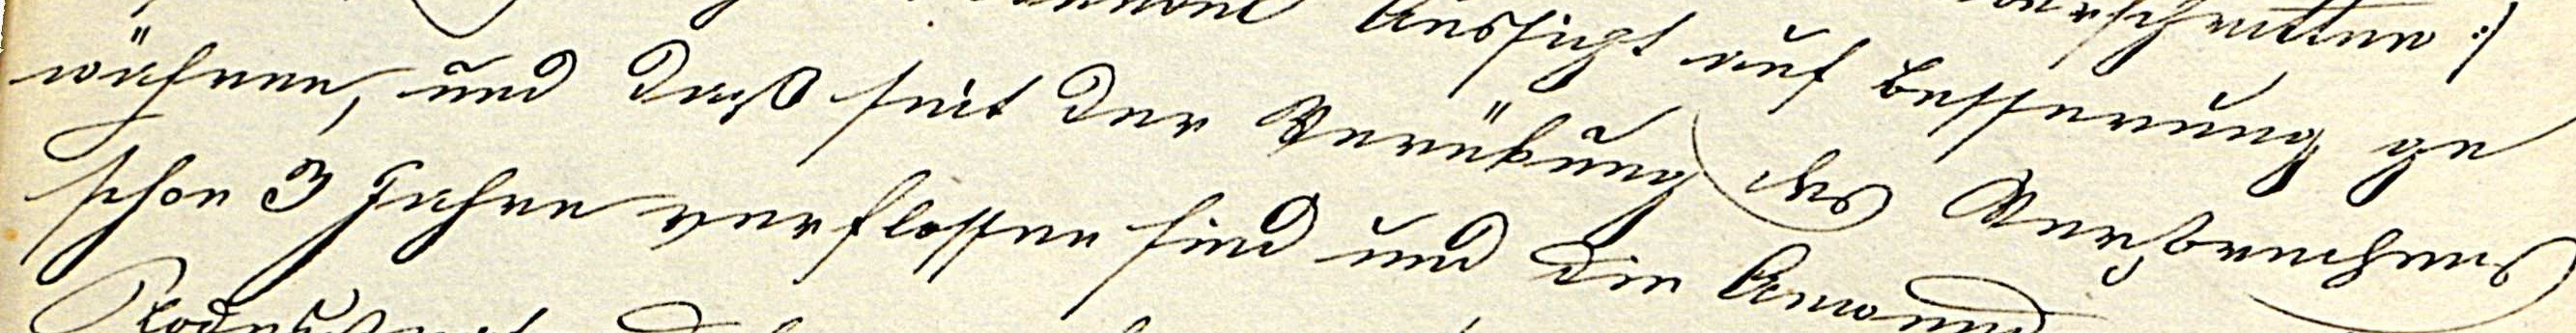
währen, und daß seit der Verübung das Verbrechens
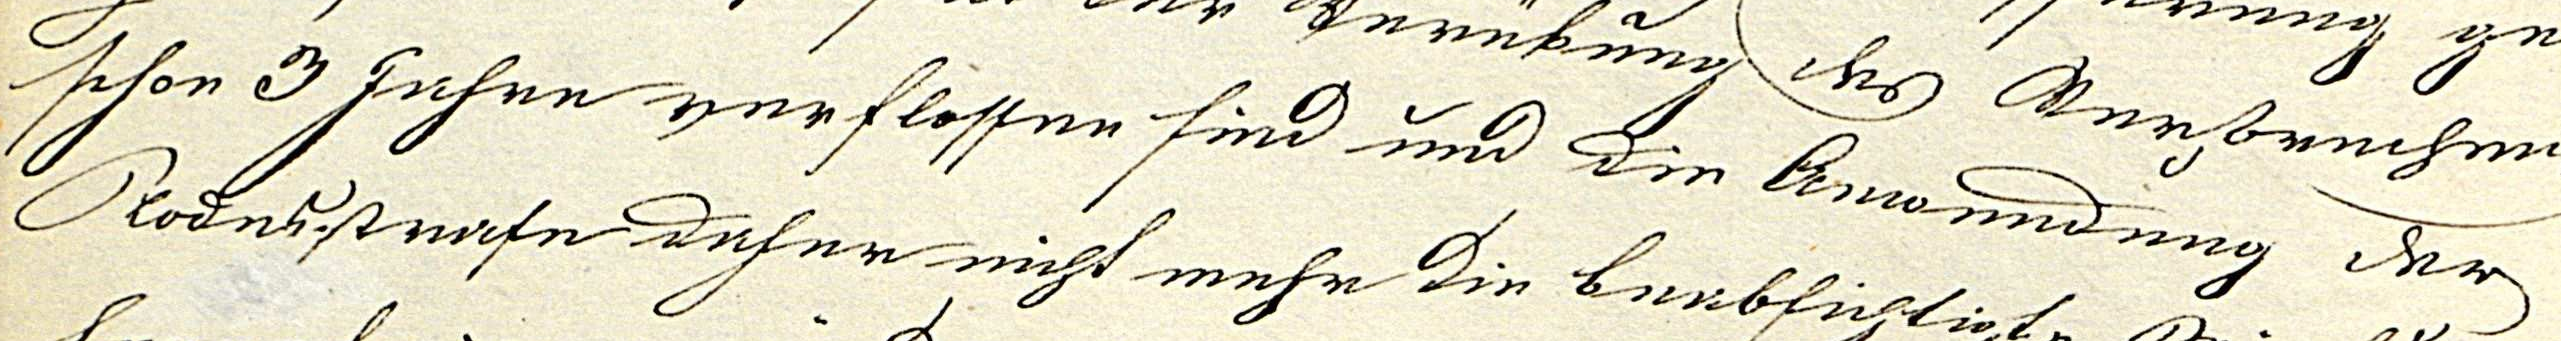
schon 3 Jahre verflossen sind und die Anwendung der
